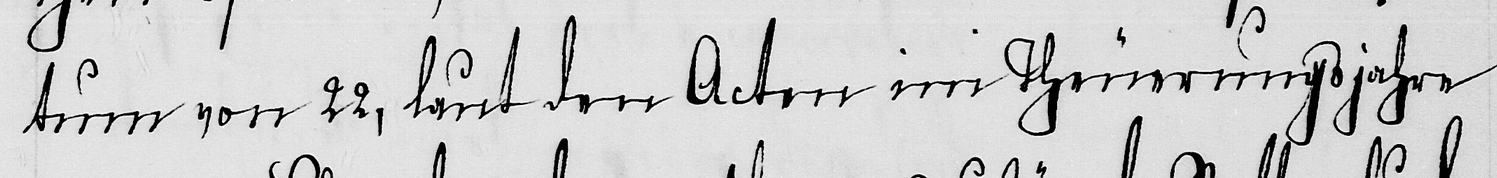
tum von 22, laut den Acten im Theuerungsjahre
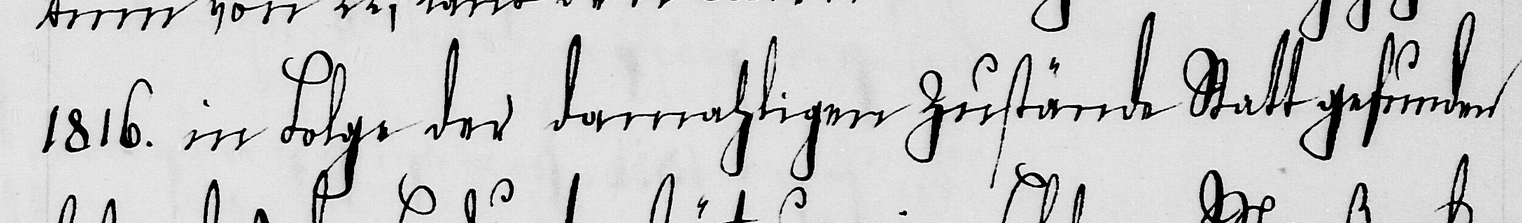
1816. in folge der damahligen Zustände Statt gefunden
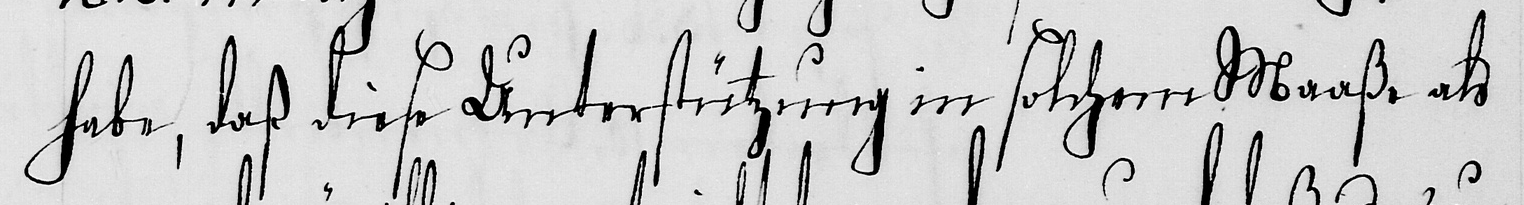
habe, daß diese Unterstützung in solchem Maaße als
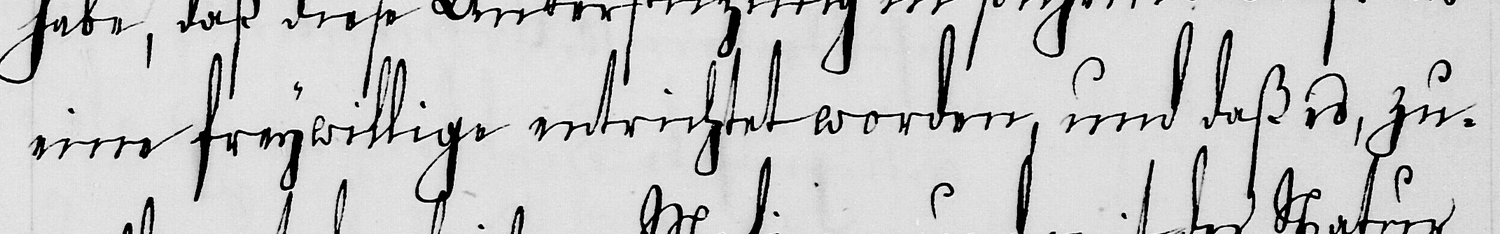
eine freywillige entrichtet worden, und daß es, zu¬
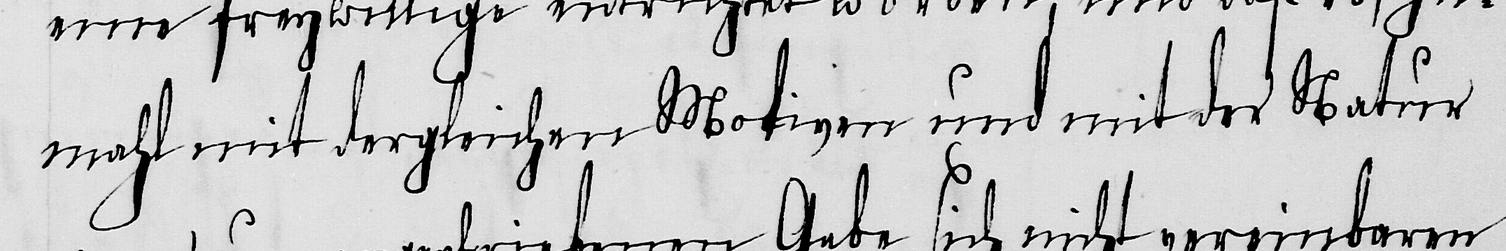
mahl mit dergleichen Motiven und mit der Natur
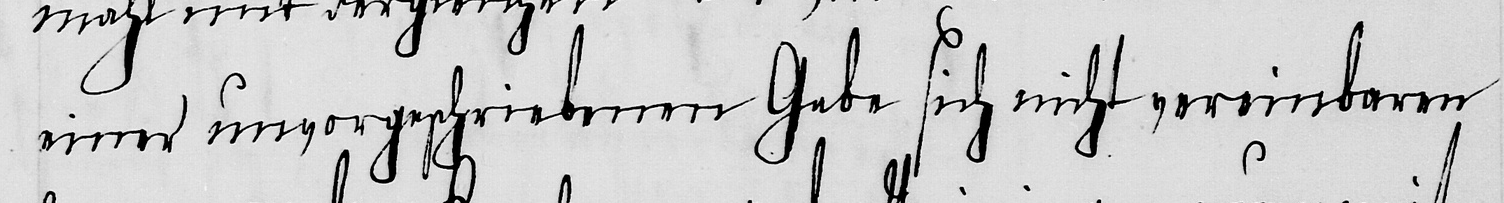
einer unvorgeschriebenen Gabe sich nicht vereinbaren
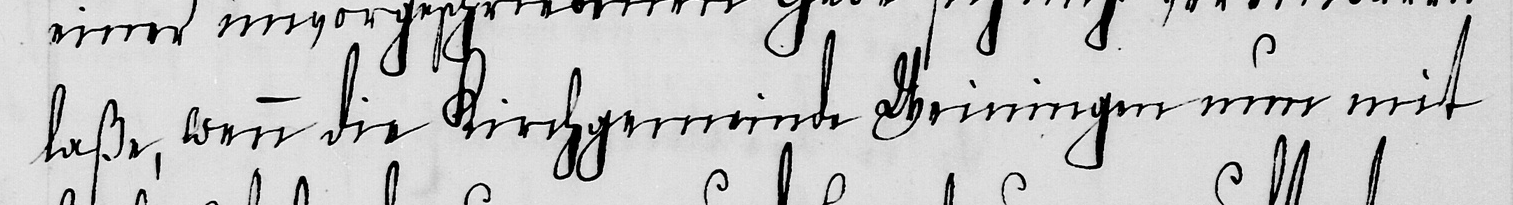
laße, wenn die Kirchgemeinde Weiningen nun mit
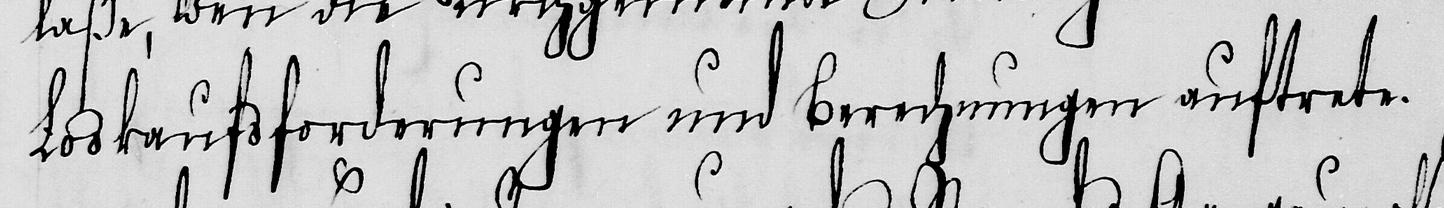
Loskaufsforderungen und Berechnungen antrete.
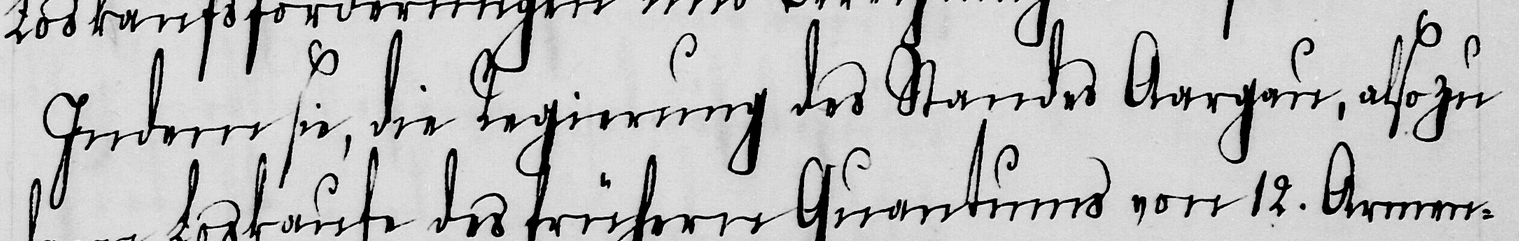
Indem sie, die Regierung des Standes Aargau, also zu
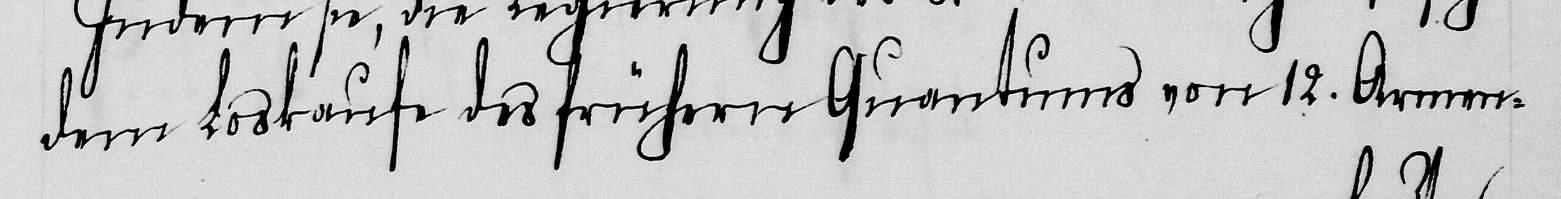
dem Loskaufe des frühern Quantums von 12. Armen-
